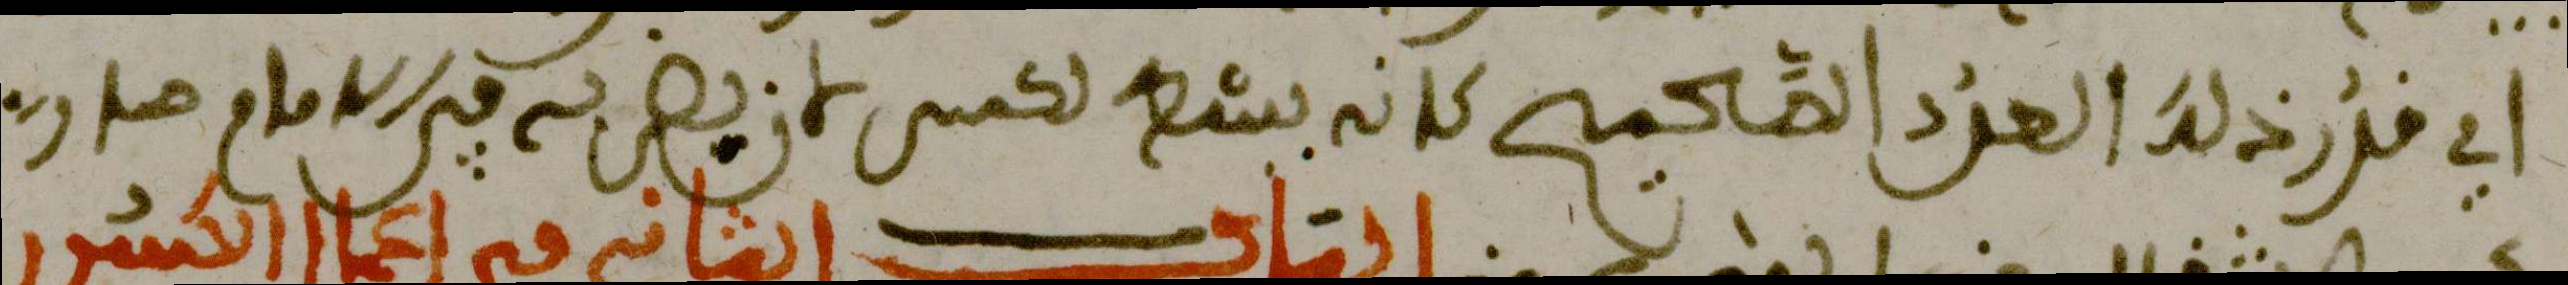اي قدّر ذلك العدد الصّحيح كانه بسط لكسر لان بضربه في الامام صار
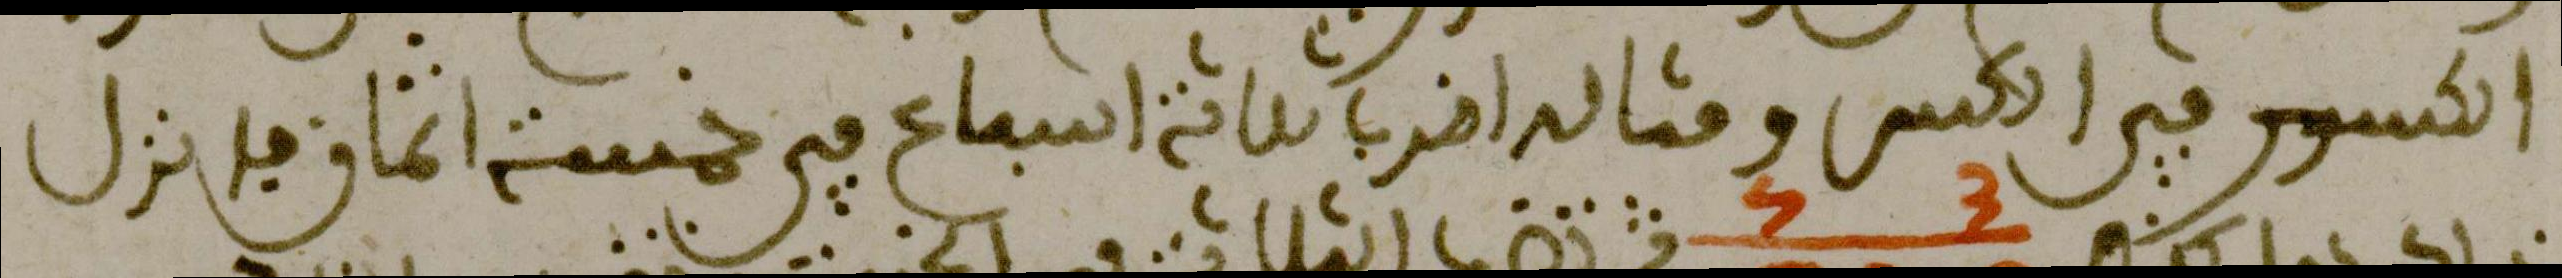الكسور في الكسر و مثاله اضرب ثلاثة اسباع في خمسة اثمان فانزل
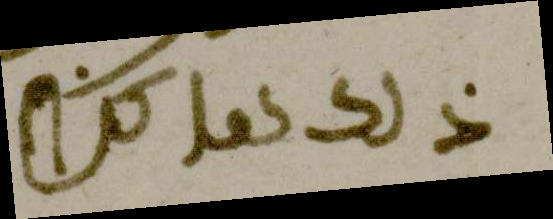ذلك هاكذا
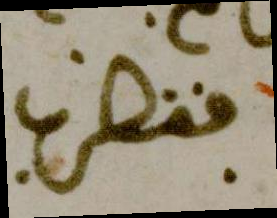فتضرب
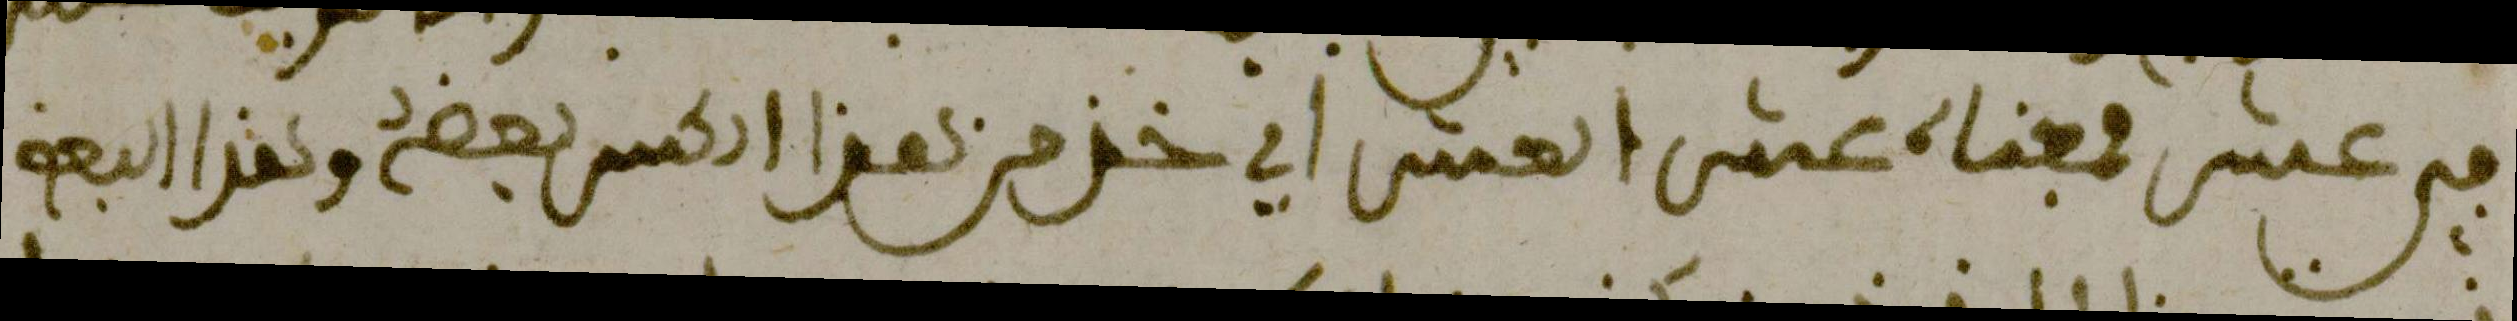في عشر فمعناه عشر العشر اي خذ من هذا الكسر بعضه و هذا النصف
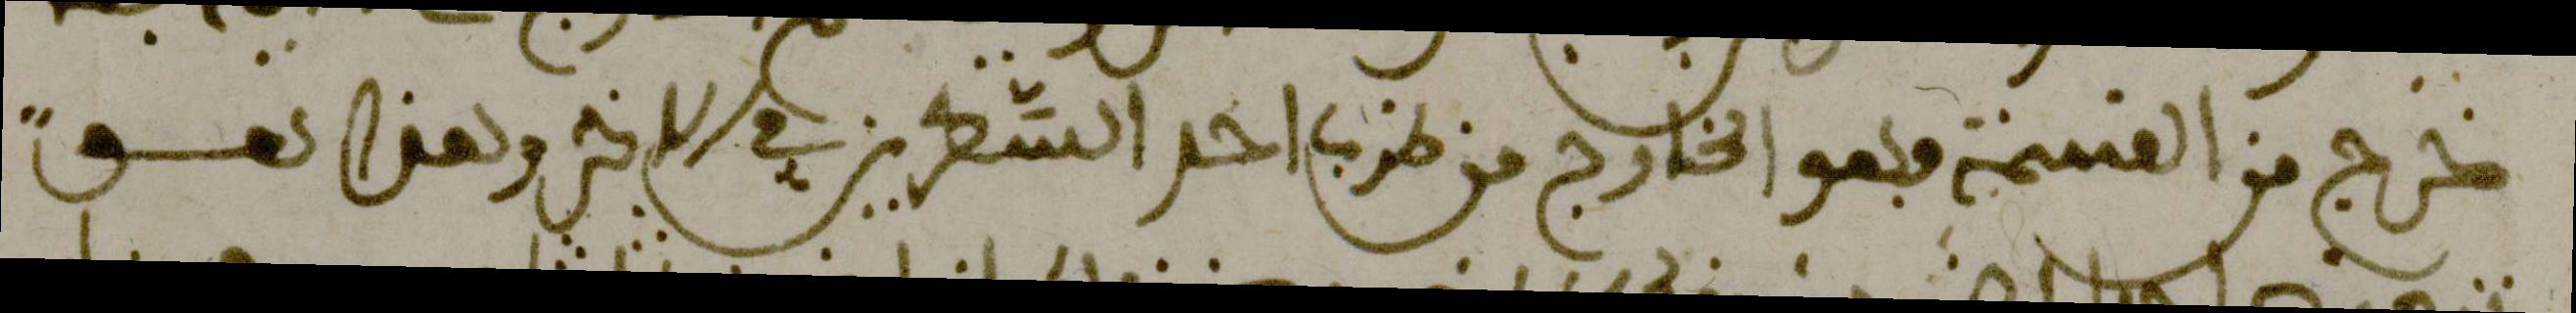خرج من القسمة فهو الخارج من ظرب احد السّطرين في الاخر و هذا هو
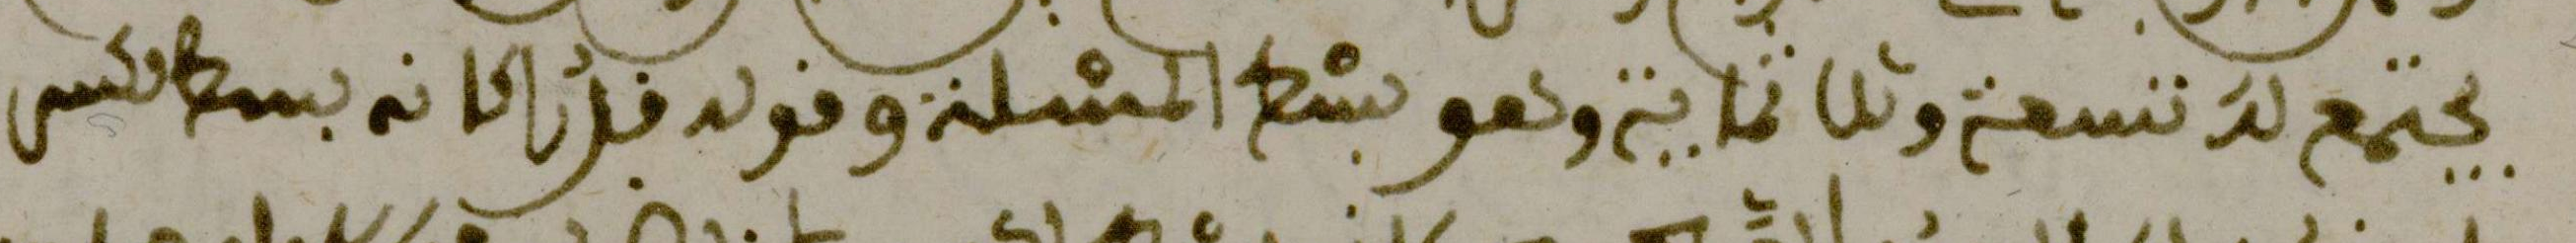يجتمع لك تسعة و ثلاثماية و هو بسط المسلة و قوله قدرا كانه بسط الكسر
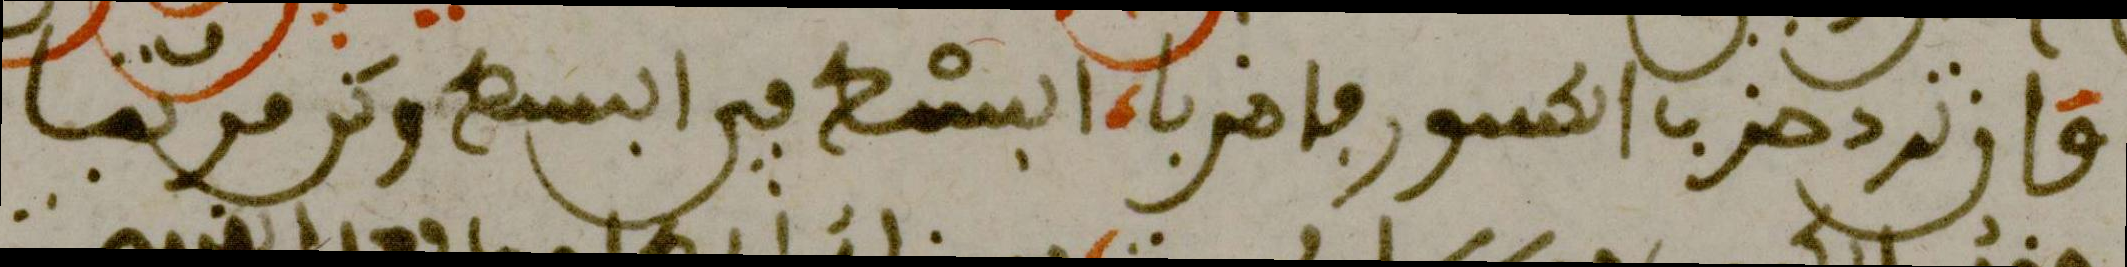فان ترد ضرب الكسور فاضرب البسط في البسط و كن مرتبا
